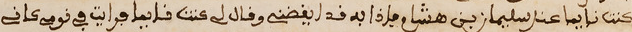كنت نايما عنل سليمان بن هشام فاذا به قد ايقضنى وقال لى كنت قايما فرايت في نومى كانى
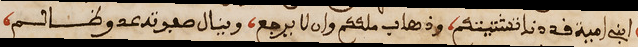ابنى امية قد دنا تشتيتكم وذهاب ملككم وان لا يرجع وينال صفوته عدو ظالم
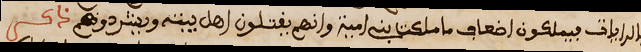بالرايات فيملكون اضعاف ما ملكت بنى امية وانهم يقتلون اهل بيته ويشردونهم ذكر
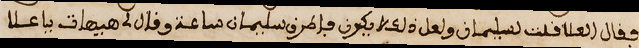فقال العلا قلت لسليمان ولعل ذلك لا يكون فاطرق سليمان ساعة وقال لى هيهات يا علا
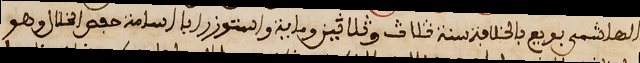الهاشمى بويع بالخلافة سنة ثلاث وثلاثين وماية واستوزر ابا اسامة حفص الخلال وهو
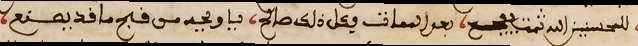للمحسنين اليه ثمت يفجع بعد الممات فكل ذلك صالح يا ويحه من قبح ما قد يصنع
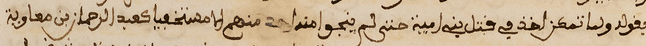بقوله ولما تمكن اخذ في قتل بنى امية حتى لم ينجوا منه احد منهم الا مستخفيا كعبد الرحمان بن معاوية
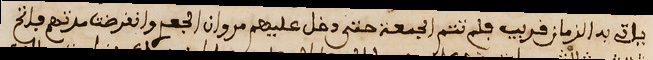ياتى به الزمان قريب فلم تتم الجمعة حتى دخل عليهم مروان الجعدى وانقرضت مدتهم فاتح
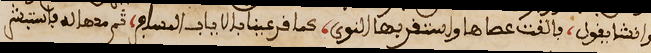وانشا يقول فالقت عصاها واستقر بها النوى كما قر عينا بالاياب المسافر ثم مدها له فاستبشر
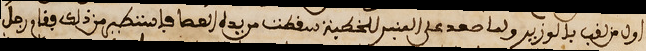اول من لقب بالوزير ولما صعد على العنبر للخطبة سقطت من يده العصا فاستطير من ذلك فقام رجل
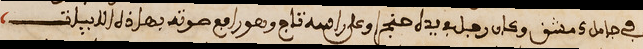في جامل دمشق وكان رجل في يده حنحرا وعلى راسمه تاج وهو رافع صوته بهاذه الابيات
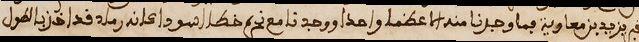قبر يزيد بن معاوية فما وجدنا منه الا عظما واحدا ووجدنا مع نحره خطا اسودا كانه رماد قد اخذ بالطول
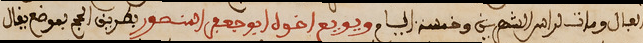الفال ومات لراس الشهرين وخمسة الام ويويع اخوه ابو جعفر المنصور بطريق الحج بموضع يقال
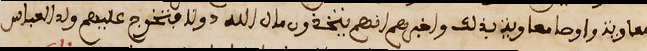معاوية واوصا معاوية بذلك واخبرهم انهم يتخذون مال الله دولا فتخوج عليهم ولد العباس
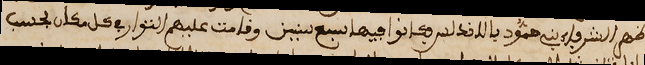ظهر الشرفاء ينى حمود بالاندلس فكانوا فيها سبع سنين وقامت عليهم التوار في كل مكان بحسب
